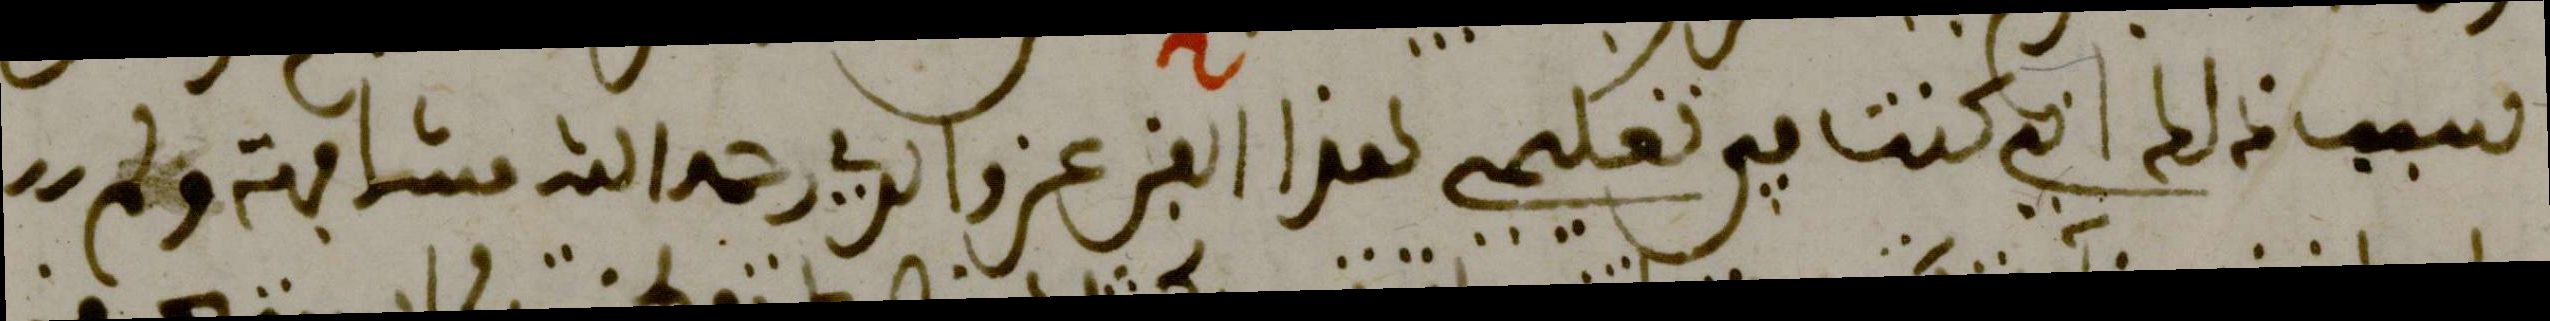سبب ذلك اني كنت في تعليمي هذا الفن عن والدي رحمه اله مشافهة ولم
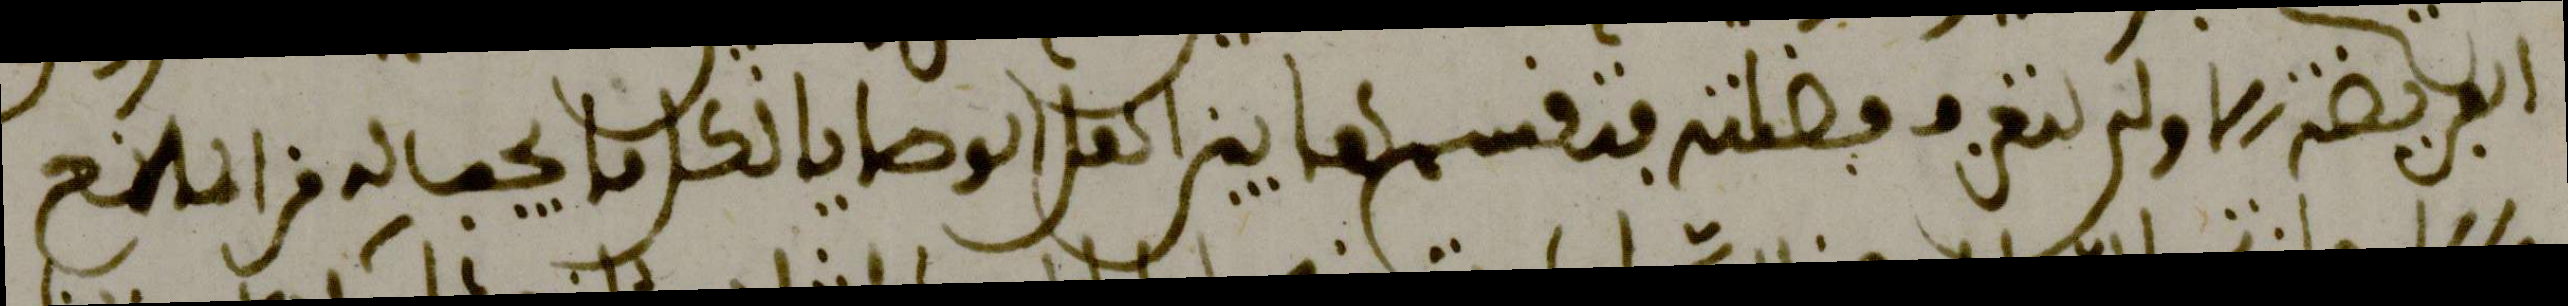الفريضة الاولى لتعرف فضلته فتقسمها بين اهل الوصايا لكل ما يجب له من المانع
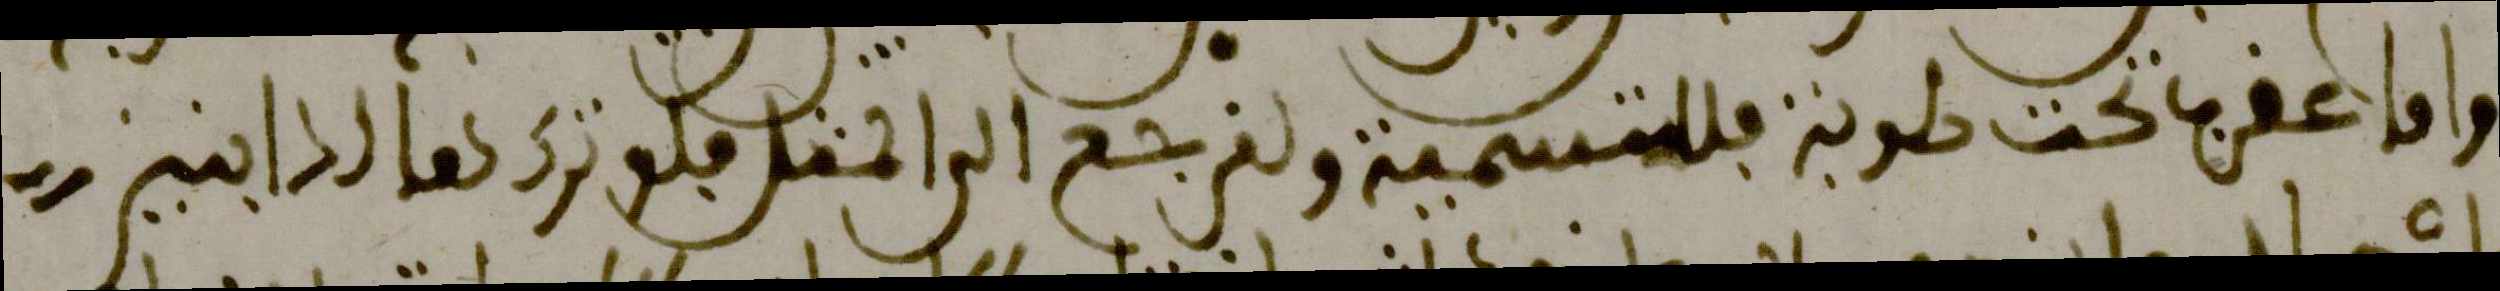واما عقرب تحت طوبة فللتسمية ولنرجع الى المثل فلو ترك هالك ابنين
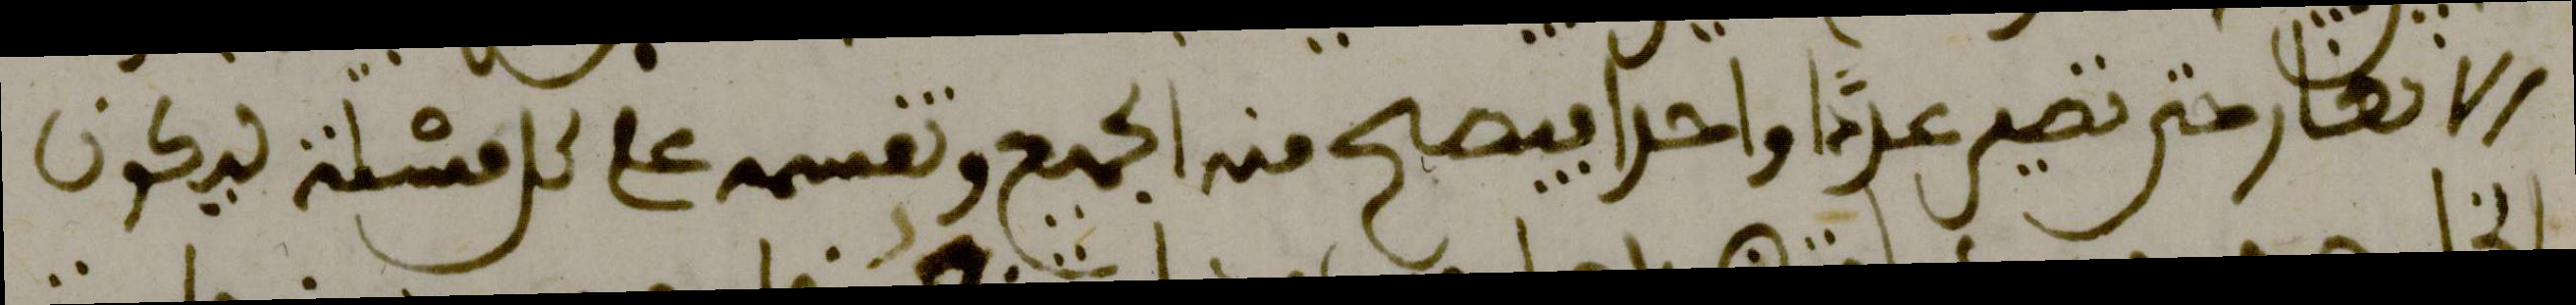الانظار حتى تصير عددًا واحدا فيصح منه الجميع وتقسمه على كل مسْلة ليكون
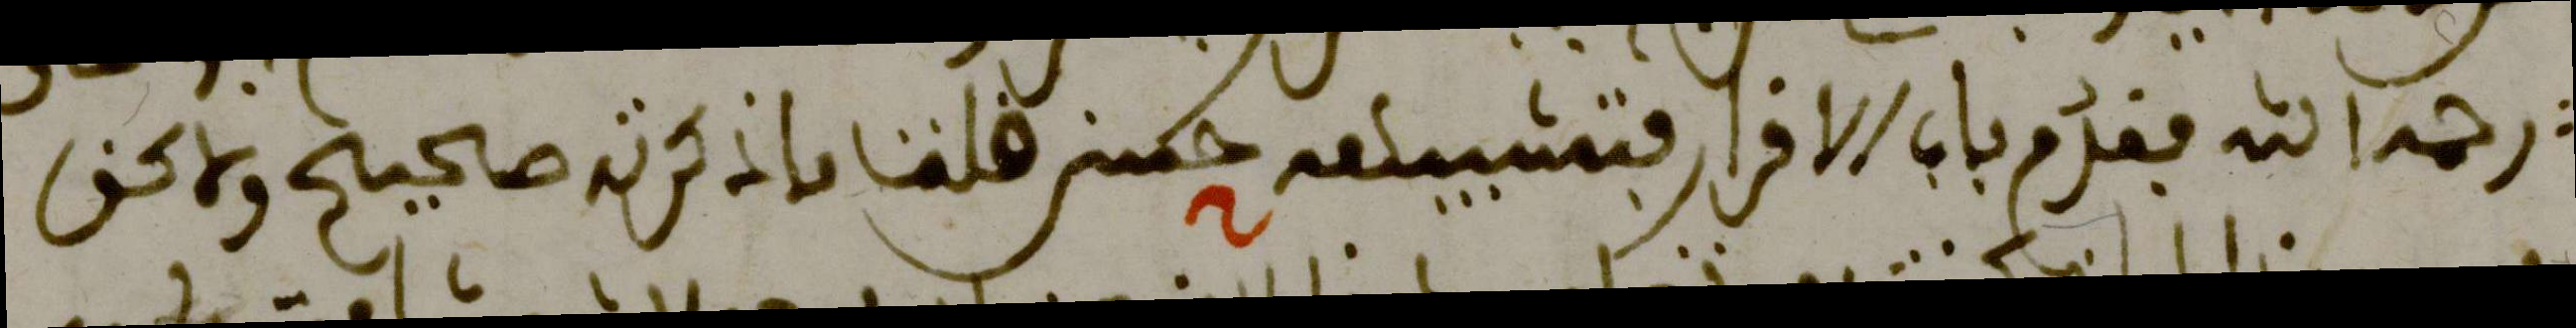رحمه الله فقدم باب الاقرار فتشبيهه حسن قلت ما ذكرته صحيح ولاكن
